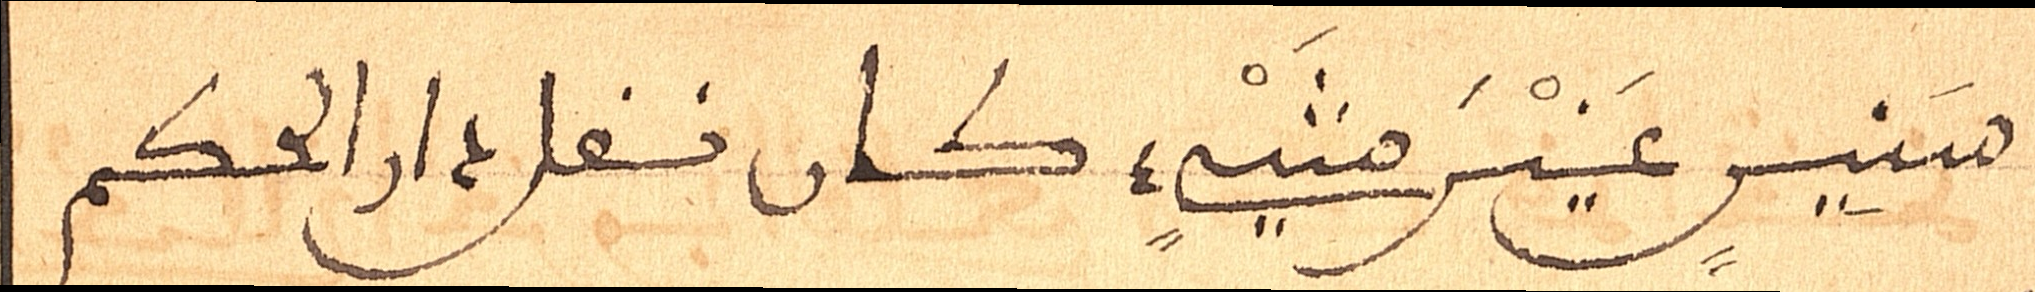سنين غير شيء كان نقل دار الحكم
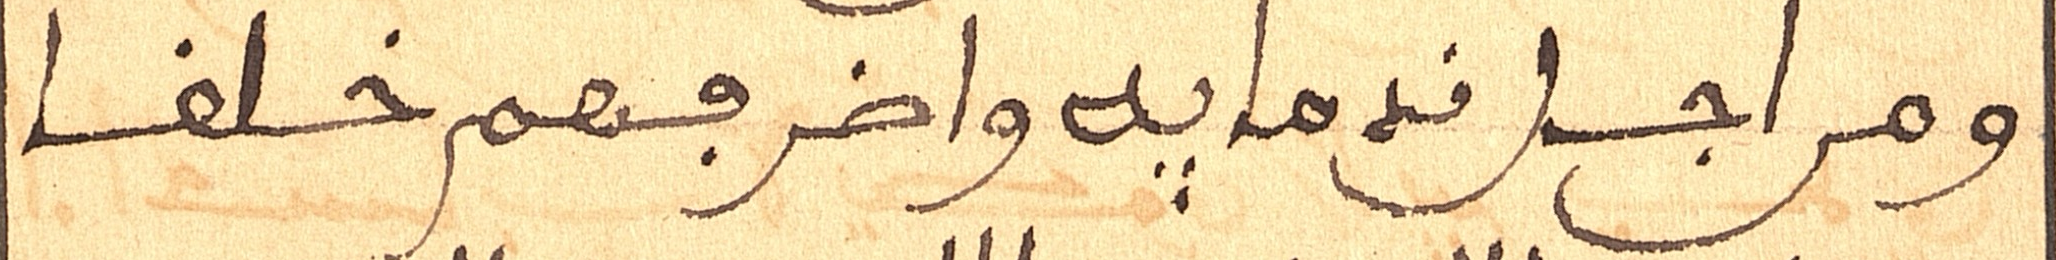ومن اجل قد مائة واضرفهم خلقا
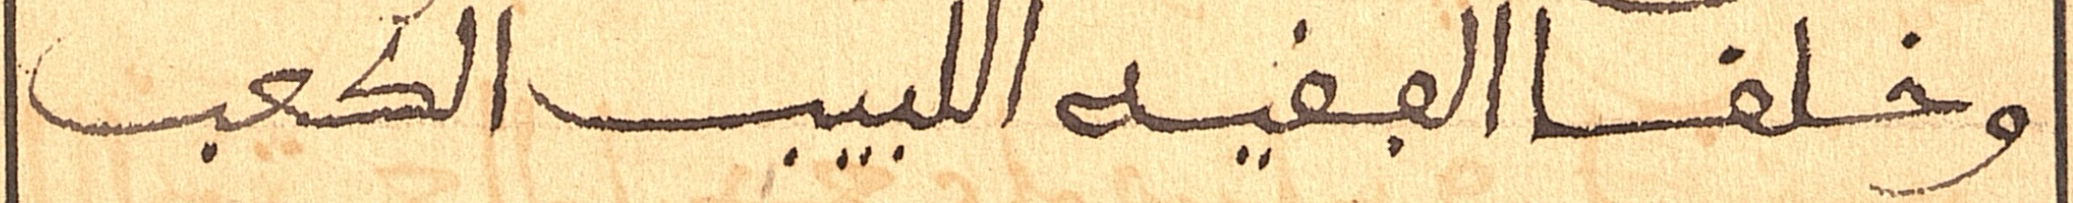وخلقا الفقيه اللبيب الكعب
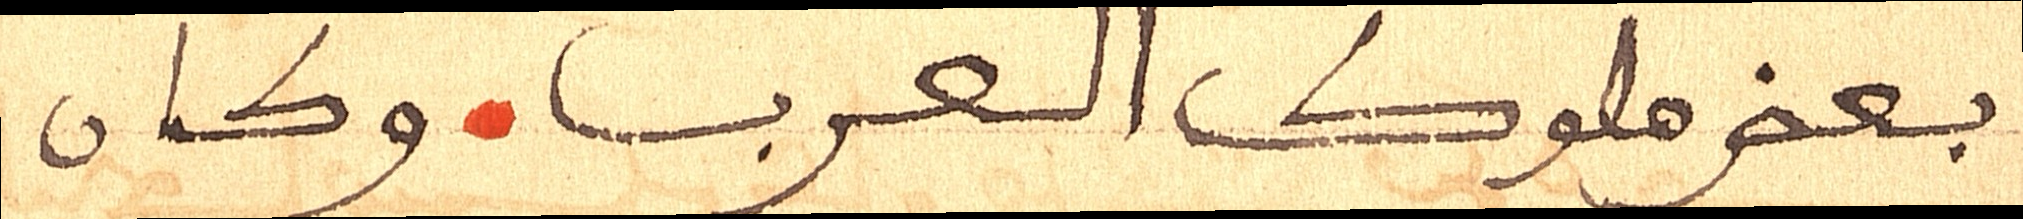بعض ملوك العرب وكان
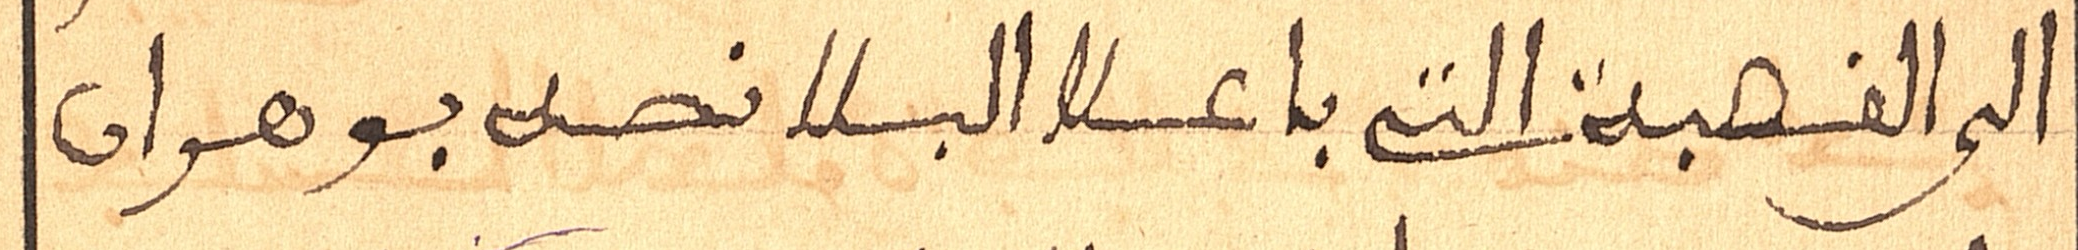الى القصبة التي باعلا البلا نصه بوهران
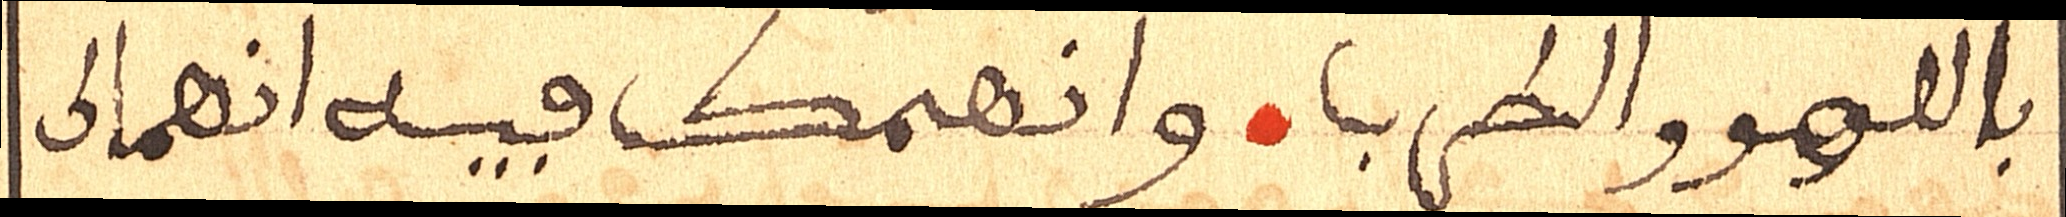باللهو والطرب وانهمك فيه انهماك
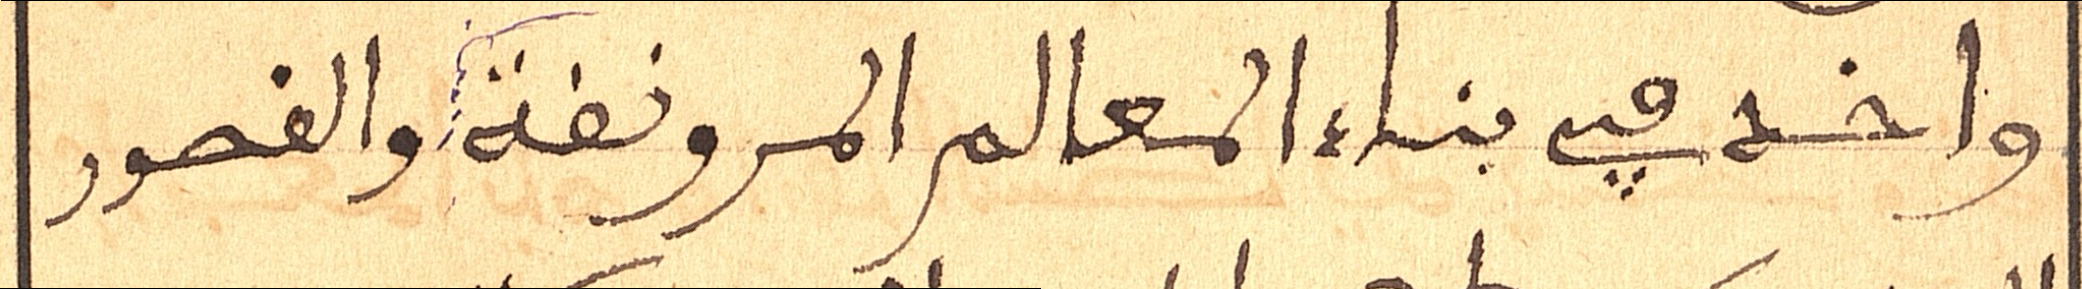واخد في بناء المعالم المرونقة والقصور
